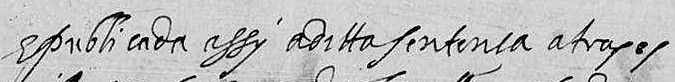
E publicada assy a ditta sentença atras es
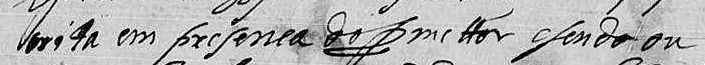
crita em presença do ꝓmottor e sendo ou
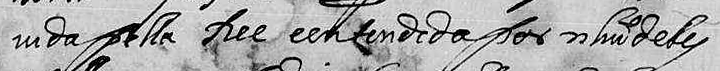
uida pella Ree e entendida por nhū deles
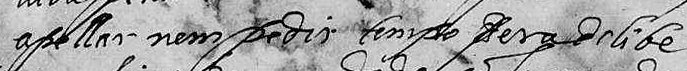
apellar nem pedir tempo pera delibe
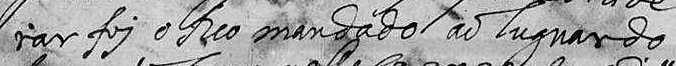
rar foj o Reo mandado ao luguar do
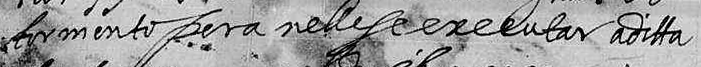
tormento pera nelle se executar a ditta
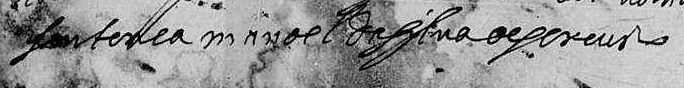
sentença manoel da sylua o escreui
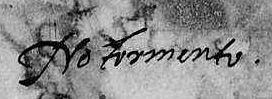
No tormento.
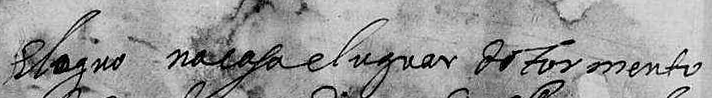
E loguo na casa e luguar do tormento
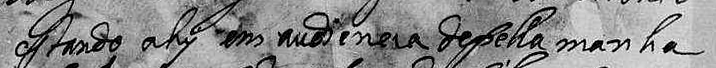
estando ahy em audiencia de pella manha
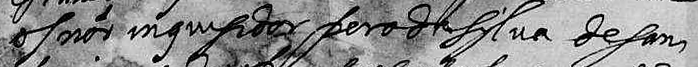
o snor̄ inquisidor pero da sylua de sam
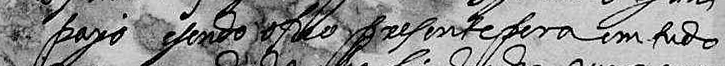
payo e sendo o Reo presente pera em tudo
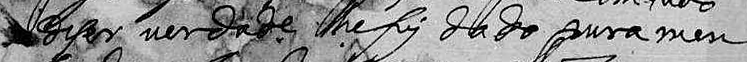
diser uerdade lhe foj dado juramen
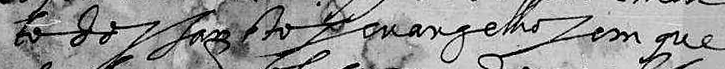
to dos sanctos euangelhos em que
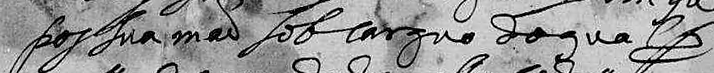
pos sua mão sob carguo do qual ꝓ
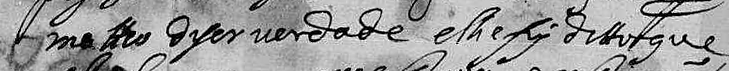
metteo diser uerdade e lhe foj ditto que
